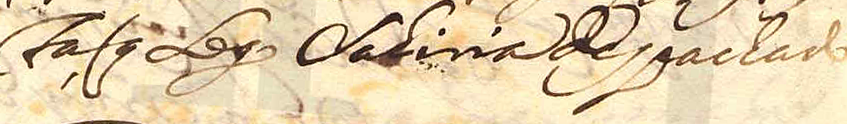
ta, q̄ Logo Sahiria despachado.
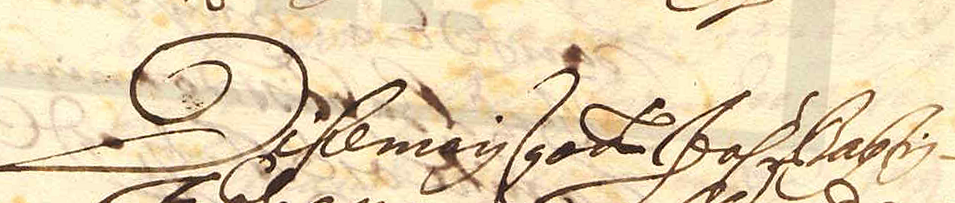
Disse mais q̄ o d̄o Joaõ Baptis
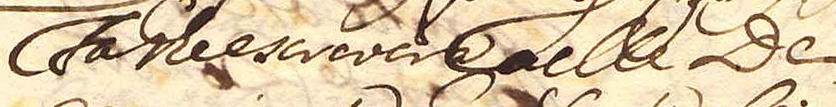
ta lhe escrevera a elle De
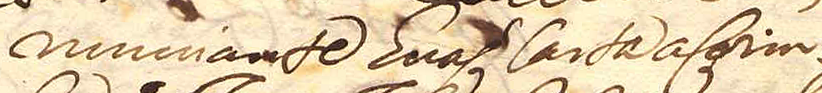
nunciante huã Carta a Coim
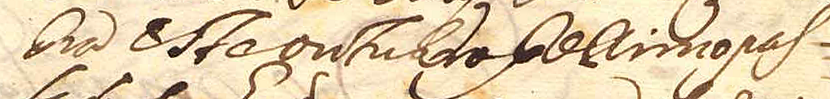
bra Este outubro pRoximo pas
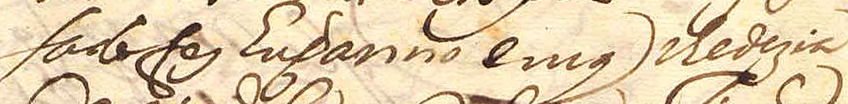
sado fez hū anno em q̄ lhe dezia
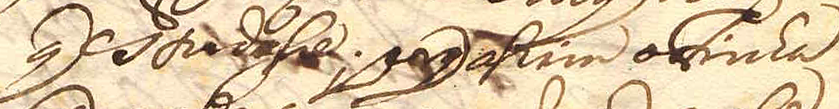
q̄ estudasse; porq̄ assim o tinha
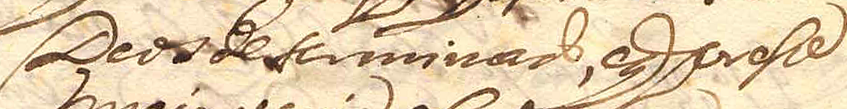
Deos determinado, e q̄ por esse
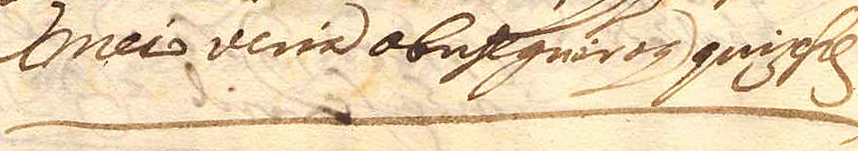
meio veria a Conseguir o q̄ quizesse
